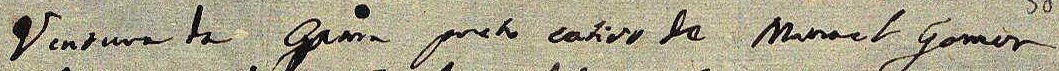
Ventura da Garra preto cativo de Manoel Gomez
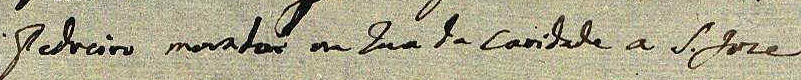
Pedreiro morador na Rua da caridade a S. Joze
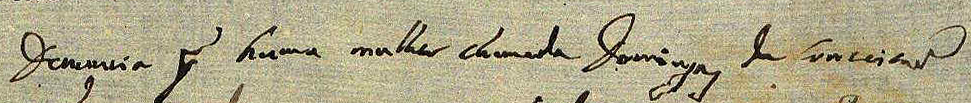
Denuncia q̄ huma mulher chamada Domingas da Conceiçaõ
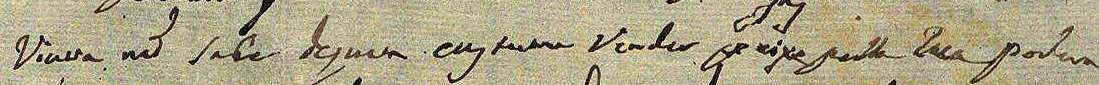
Viuva naõ sabe de quem custuma vender peixe pella Rua podera
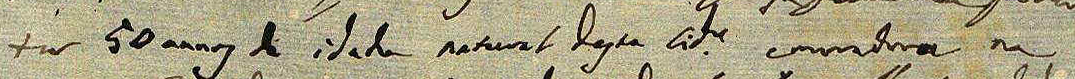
ter 5O annos de idade natural desta Cid.e e moradora na
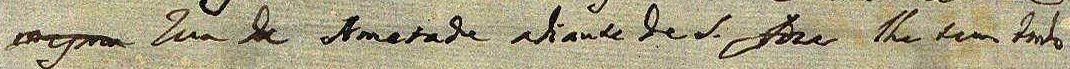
mesma Rua da Ametade a diante de S. Joze lhe tem dando
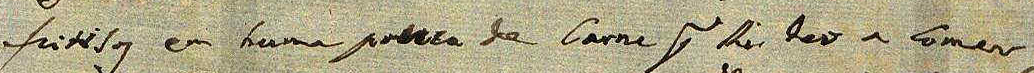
feitisos em huma pouca de Carne q̄ lhes deo a comer
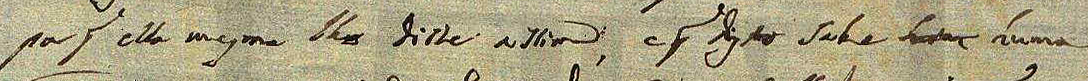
por q̄ ella mesma lhes disse assim, e q̄ disto sabe hum huma
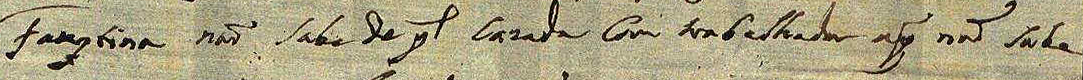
Faustina naõ sabe de q̄ cazada Com trabalhador a q̄ naõ sabe
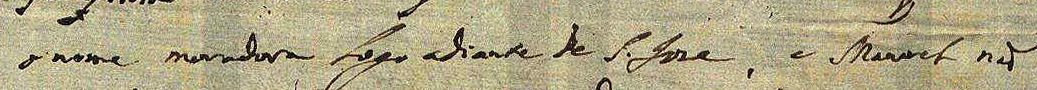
o nome moradora Logo adiante de S. Joze, e Manoel naõ
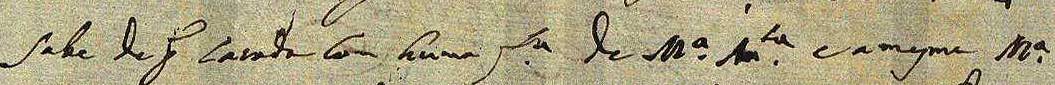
sabe de q̄ Cazado Com huma f.a de M.a An.ta e a mesma M.a
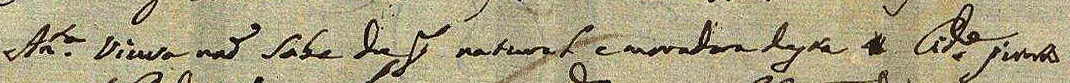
An.ta viuva naõ sabe de q̄ natural e moradora desta _ Cid.e junto
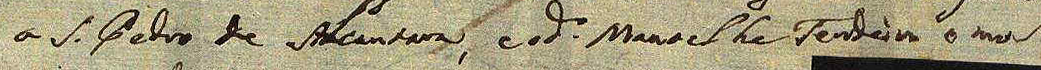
a S. Pedro de Alcantara, e o d.o Manoel he Tendeiro e mor
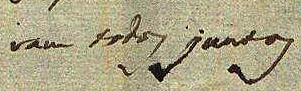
ram todos juntos
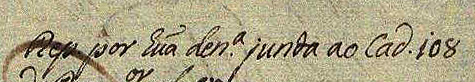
Rep. por hūa den.a junta ao Cad. i08
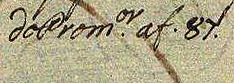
do Prom.or a f. 87.
